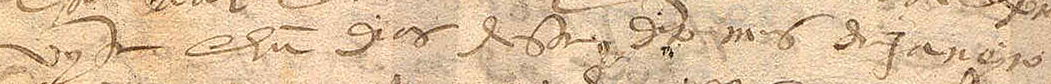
vȳte e hū dias deste dito mes de Janejro
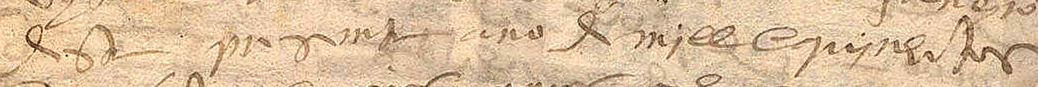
deste presemte ano de mjll e qujnhētos
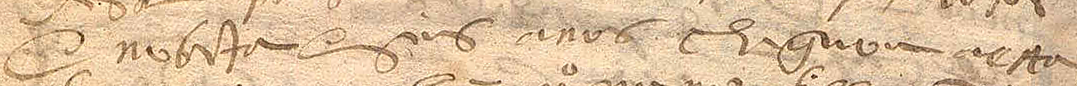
e novēta e seis anos cheguou a esta
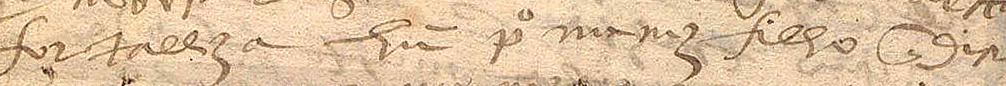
fortalleza hū po nunez filho q̄ dise
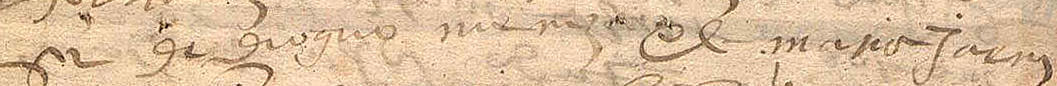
ser de dioguo nunez e de maria Jaem
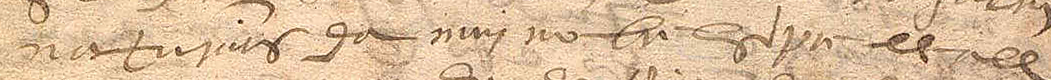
naturaes da muj nobre sēpre leall
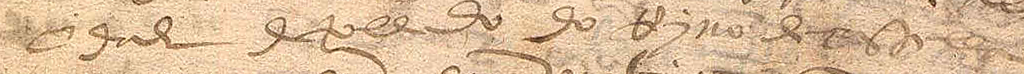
cidade de tolledo do Rejno de castella
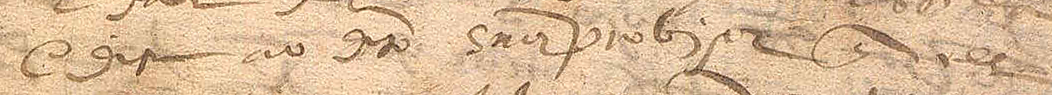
e dise ao dito sn̄or provjsor q̄ elle
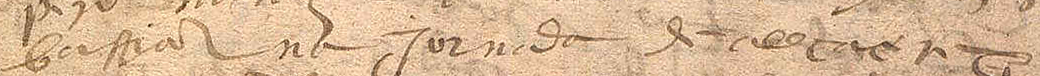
bastiaõ na Jornada de allcacere e
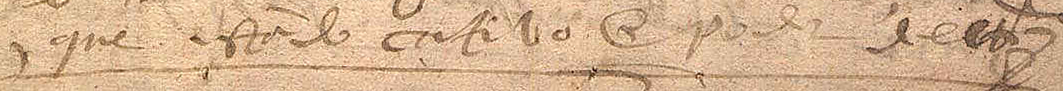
que estādo cativo ē poder dell Rej
